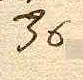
36
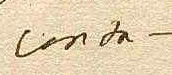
conta-
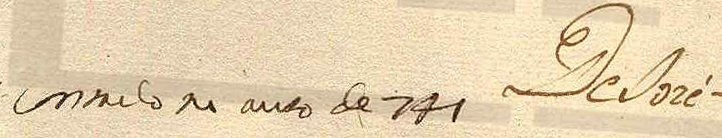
contado no auto de 741 De Iozé
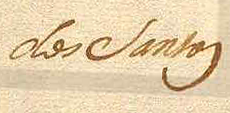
dos Santos
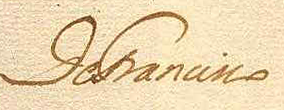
De Francisco
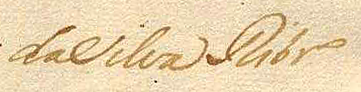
da Silva Ribro
